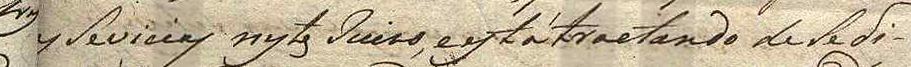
Sevicias neste Iuizo, e está tractando de Se di
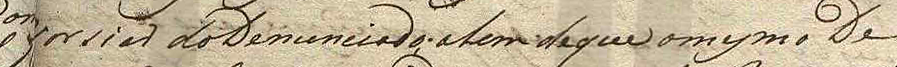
orsiar do Denunciado; alem de que o mesmo De
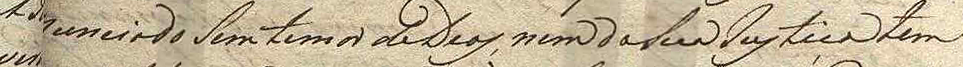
nunciado Sem temor de Deos, nem da Sua Iustiça tem
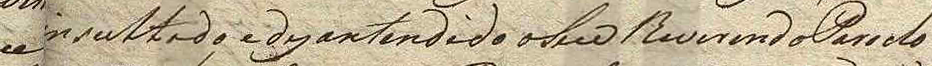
nsultado, e desantendido o Seu Reverendo Parocho
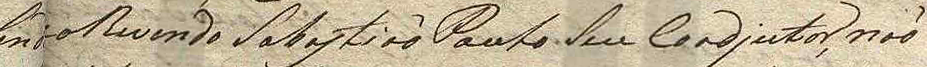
o Revendo Sabastiaõ Paulo Seu Coadjutor, naõ
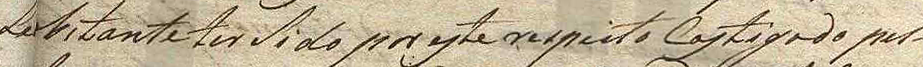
bstante ter Sido por este respeito Castigado pel
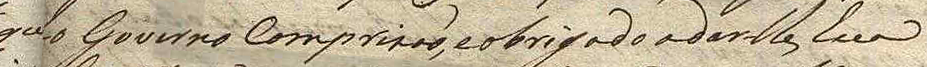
o Governo Com prizaõ, e obrigado a darlhe hua
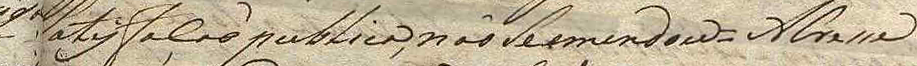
SatisfaÇaõ publica, naõ Se emendou = ACresse
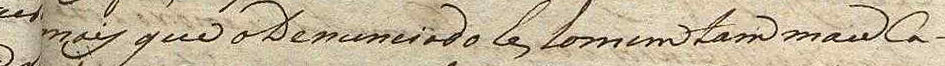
mais que o Denunciado he homem tam mau Ca
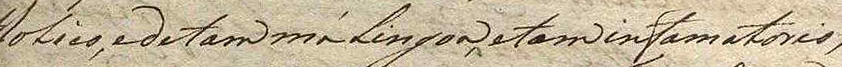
olico, e de tam má lingoa, e tam infamatorio,
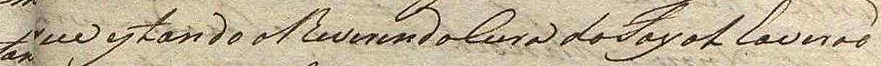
ue estando o Reverendo Cura do Fayal haveraõ
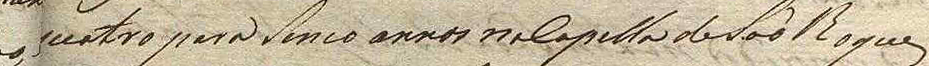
uatro para Sinco annos na Capella de Saõ Roque
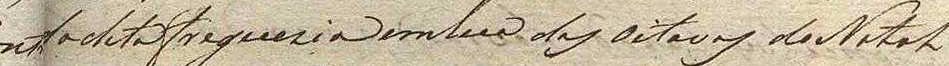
a dita freguezia em hua das oitavas do Natal
